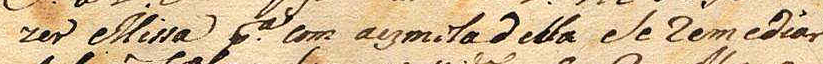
zer Missa p.a com a ezmola della se Remediar
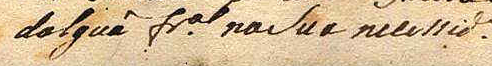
dalguā fr.a na sua necessid.e
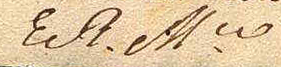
E R. M.ce
